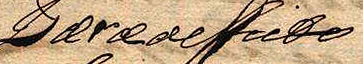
Para o effeito
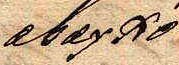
abayxo
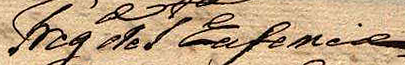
Frega de Sta Eufemia
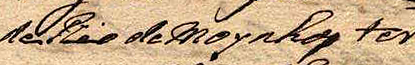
de Rio de moynhos ter
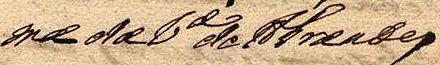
mo da Va de Abrantes
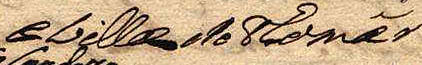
e Villa de Tomâr
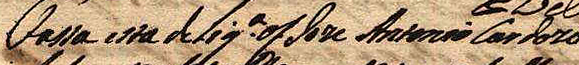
Passa esta delig.a o s Ioze Antonio Cardozo
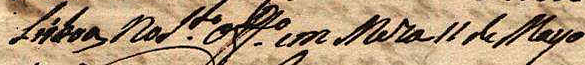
Lisboa no s.o off.o em Meza 11 de Mayo
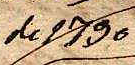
de 1790
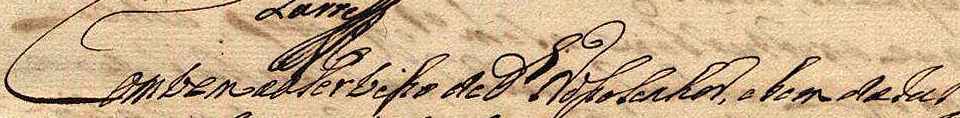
Comvem ao servisso de D.s Nosso senhor, e bem de Ius
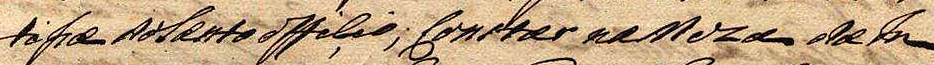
tissa no santo offiçio; Constar na Meza da In
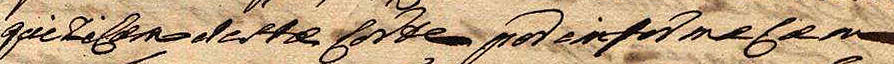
quiZiCam desta Corte por informaCam
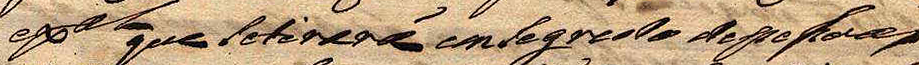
exal que se tirará em segredo de pessoas
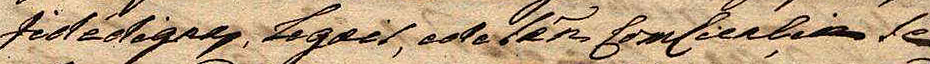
fidedignas, Legaes, e de sãns ComCiençia se
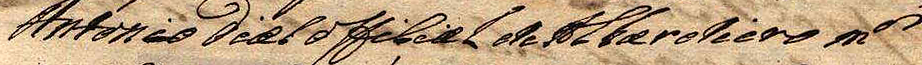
Antonio dial offiçial de Albareliero mor
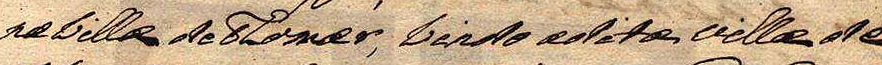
na villa de Tomar, vindo a dita villa de
